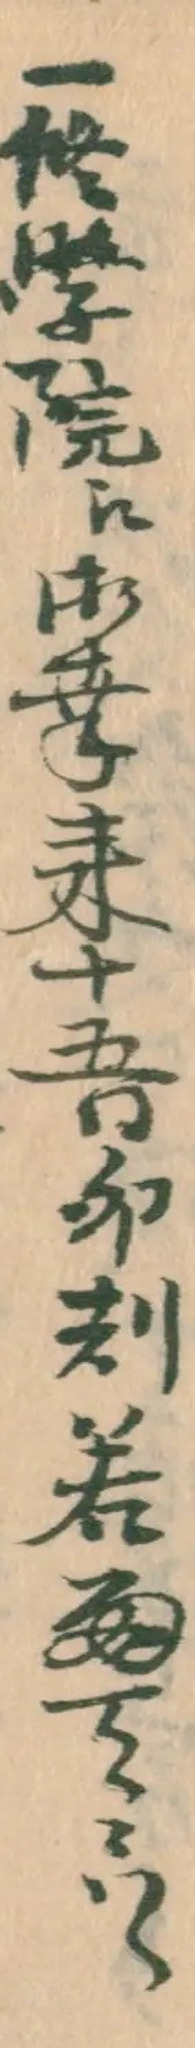一修学院え御幸来十五日卯刻若雨天候ハヽ
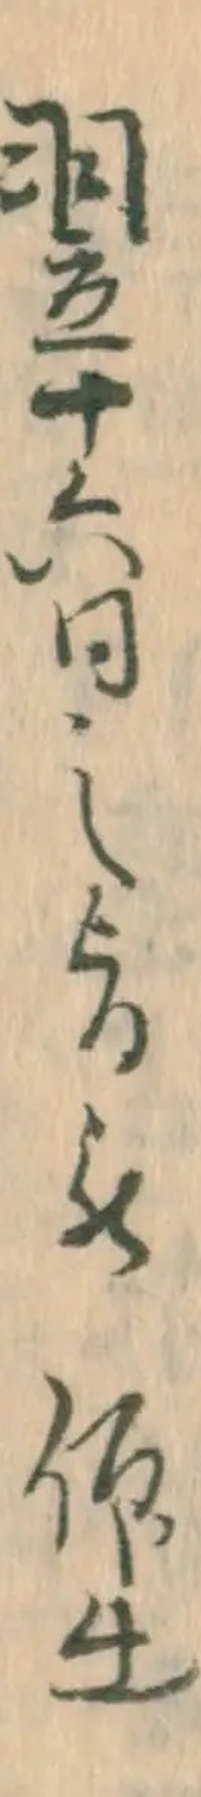翌十六日之旨被仰出
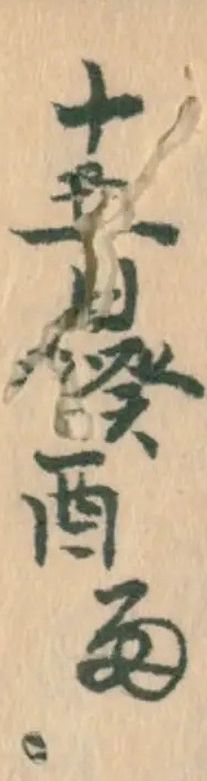十五日癸酉雨
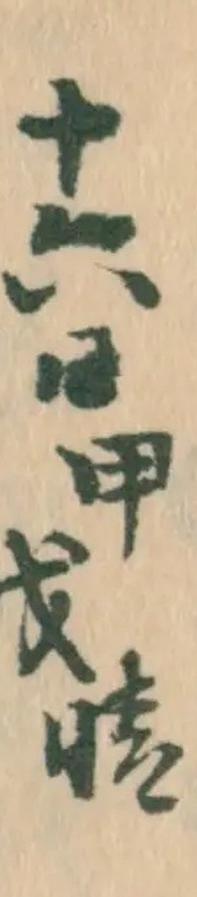十六日甲戌晴
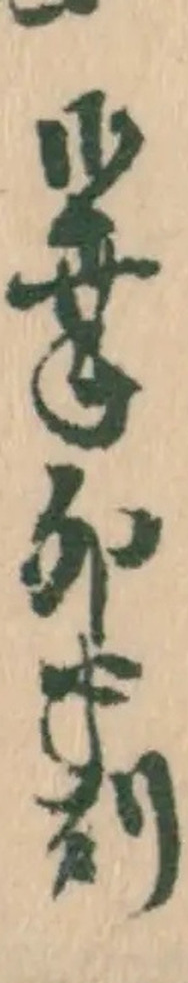還幸丑半刻
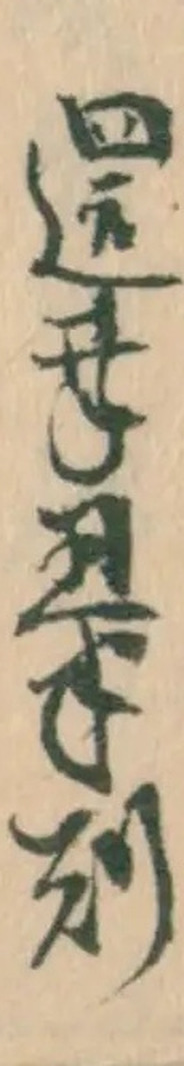還幸丑半刻
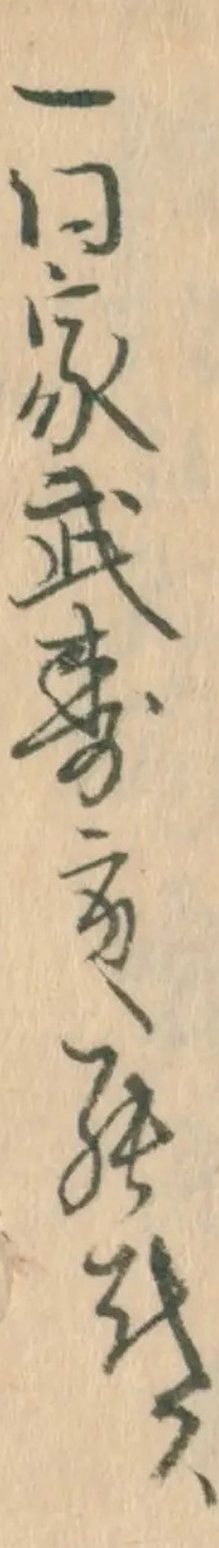一同家武寿方へ罷越ス

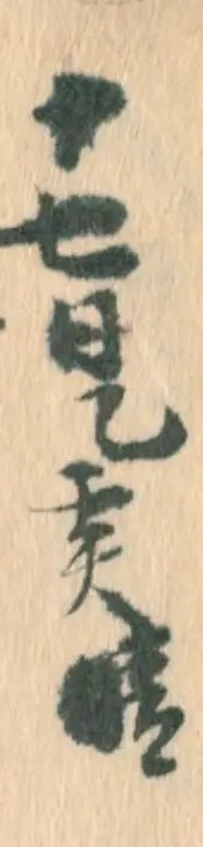十七日乙亥晴
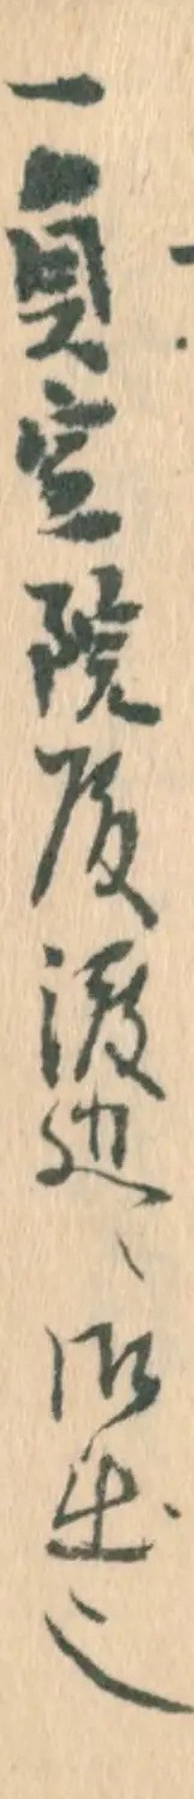一貞室院殿渡辺へ御出也
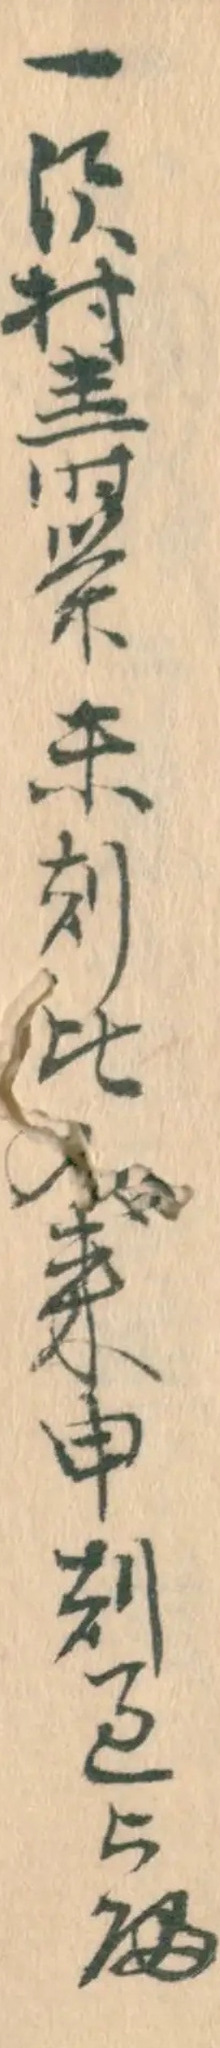一沢村寿栄未刻頃入来申刻過被帰
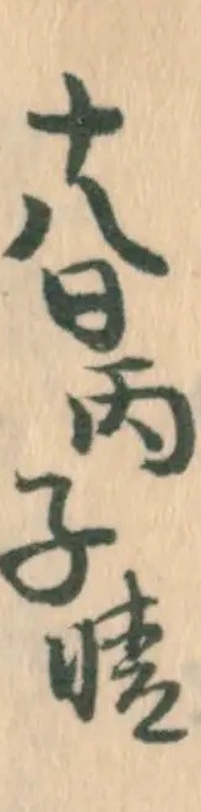十八日丙子晴
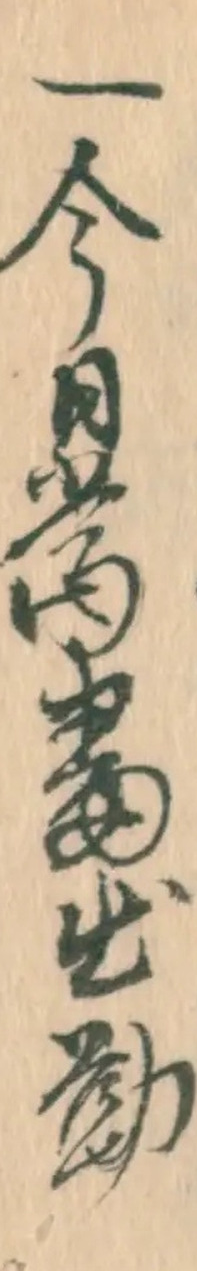一今日当番出勤
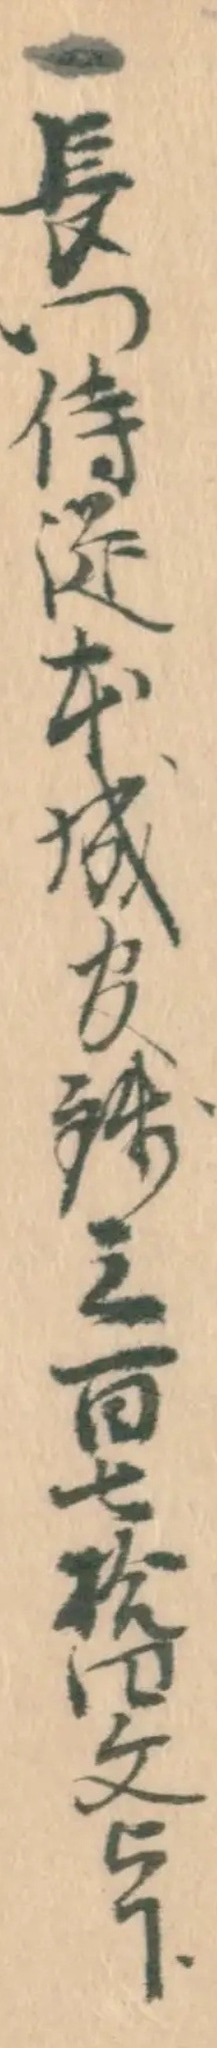一長門侍従本成官銭三百七拾四文被下
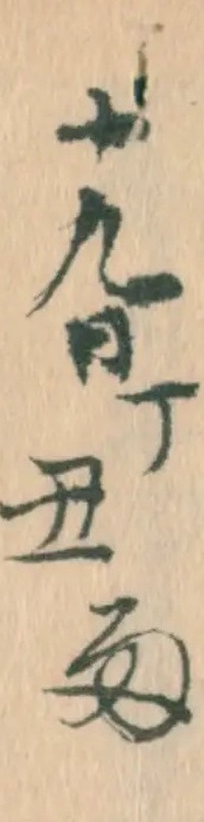十九日丁丑雨
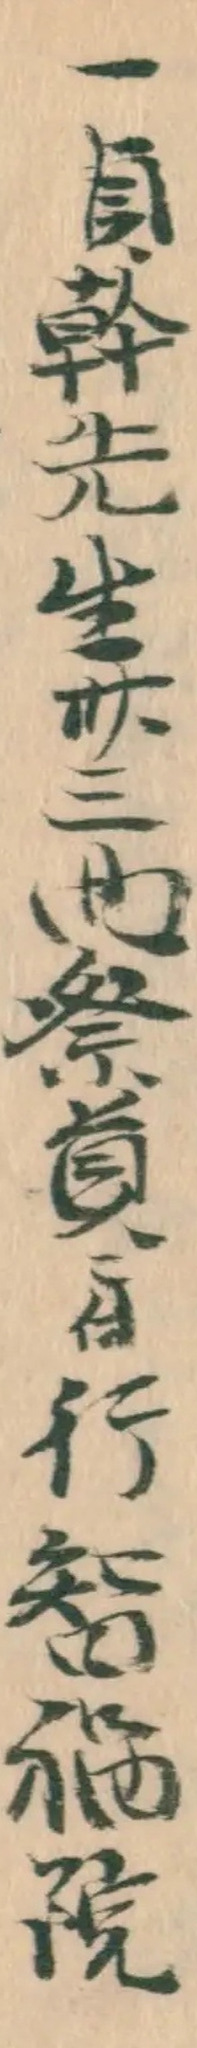一貞幹先生卅三回祭奠ニ付行智福院
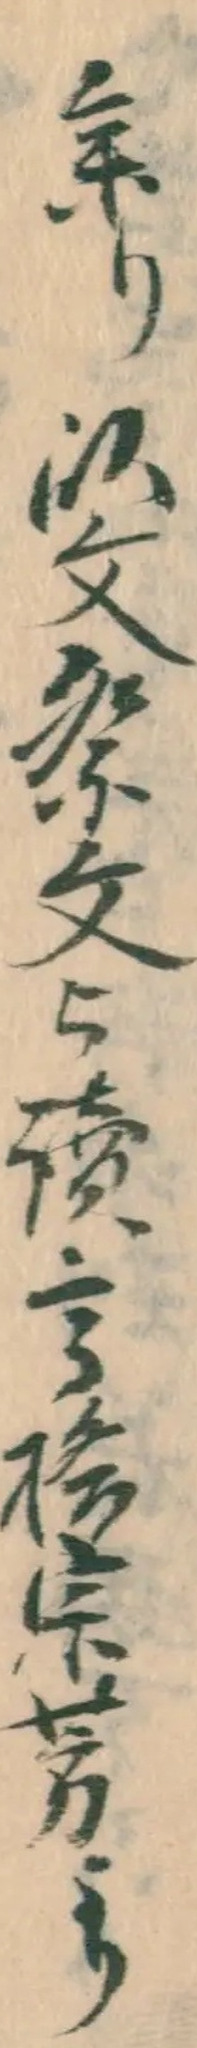参り以文祭文被読高橋宗芳より
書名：禁裏御所御用日記. [131]
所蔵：国立国会図書館 National Diet Library, JAPAN
